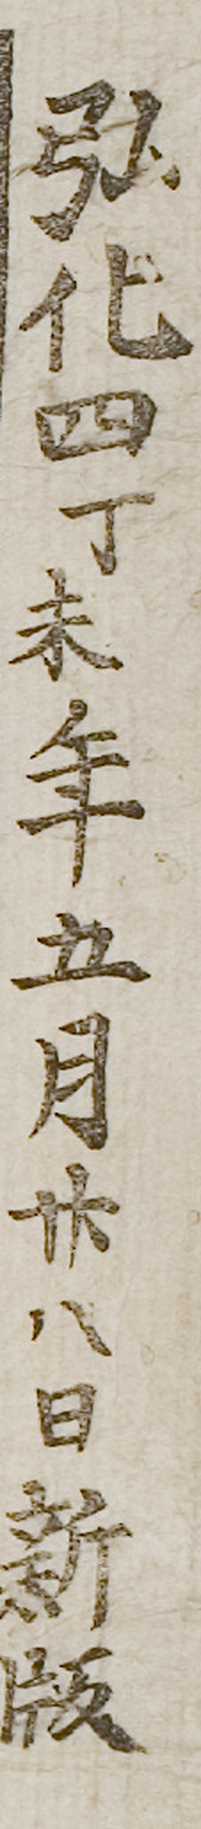弘化四丁未年五月廿八日新版
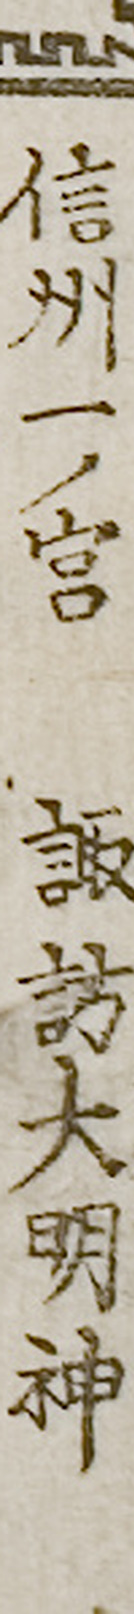信州一ノ宮諏訪大明神
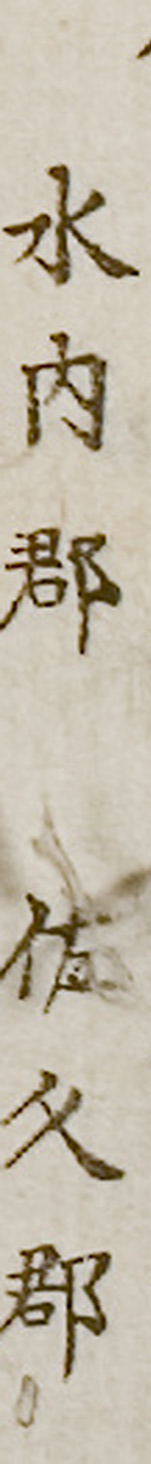水内郡佐久郡
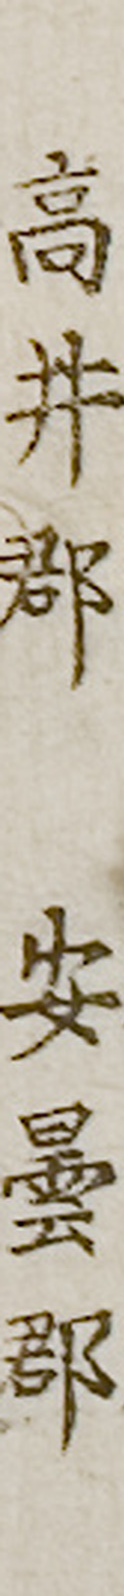高井郡安曇郡
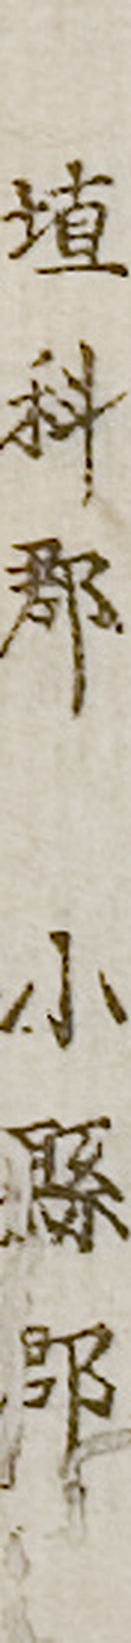埴科郡小県郡
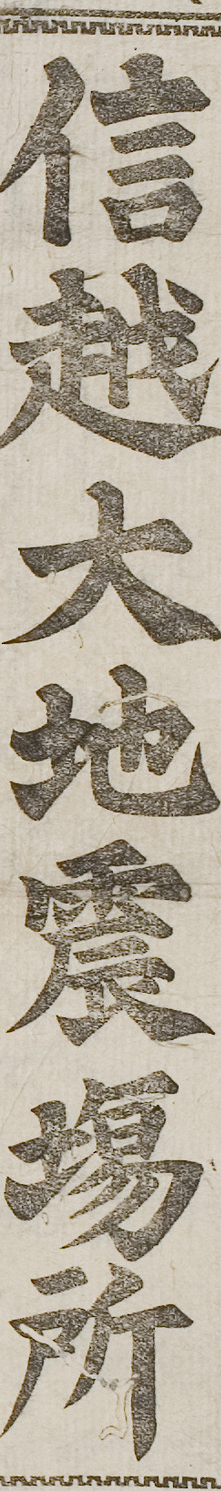信越大地震場所
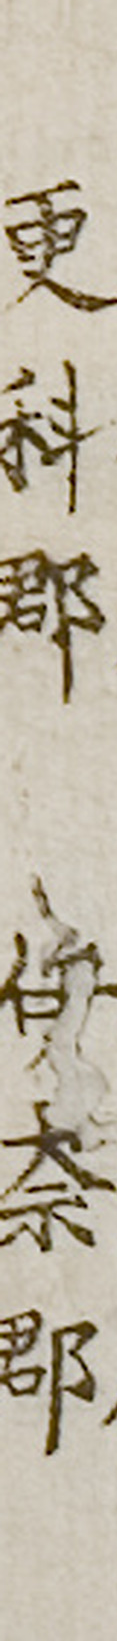更級郡伊奈郡
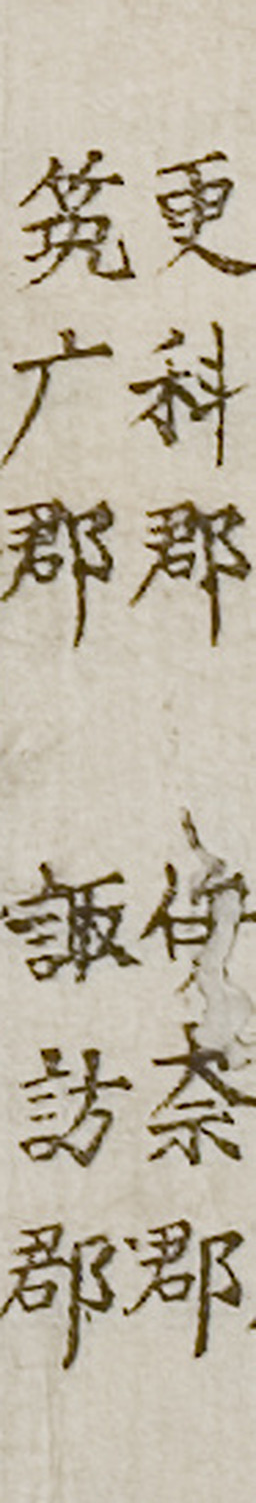筑摩郡諏訪郡
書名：信越大地震場所
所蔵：東京大学総合図書館 General Library in the University of Tokyo, JAPAN
